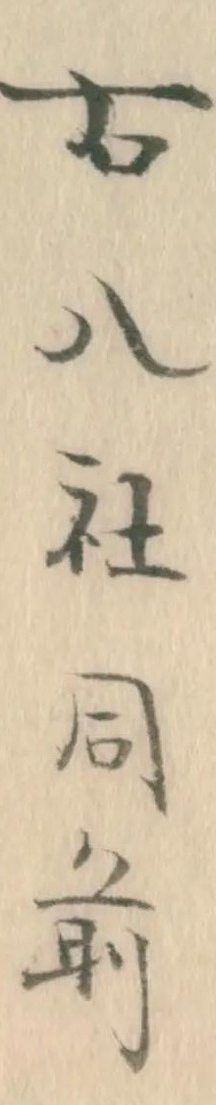右八社同前

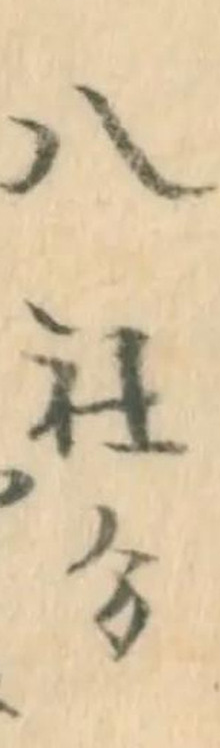八社分
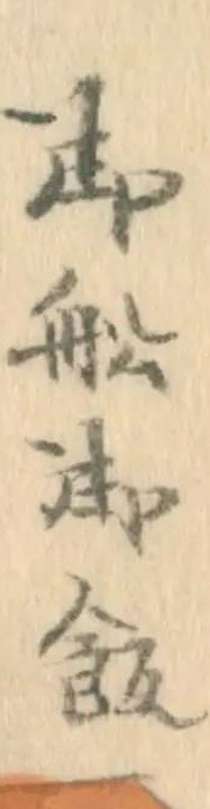御船御餅
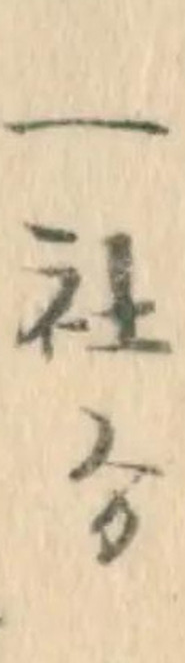八社分
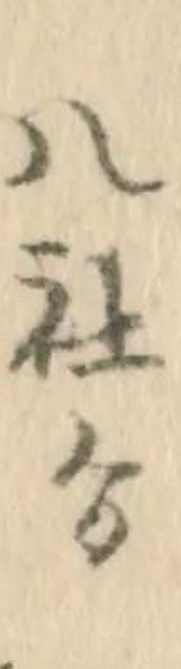八社分
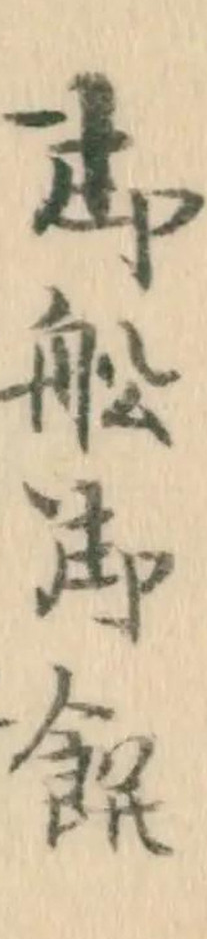御船御餅
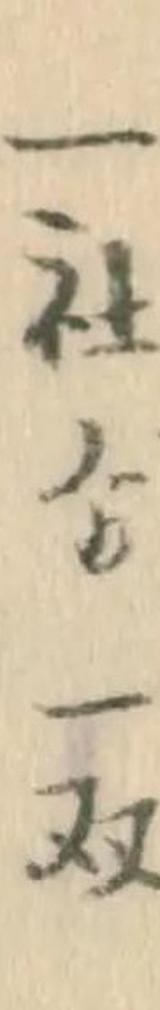一社分一双
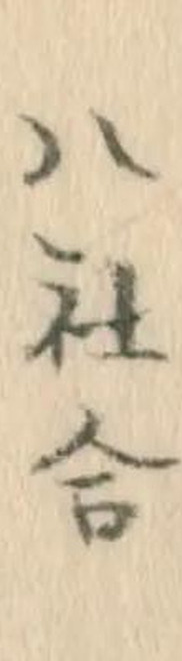八社合
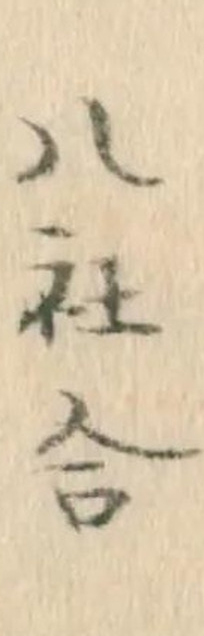八社合

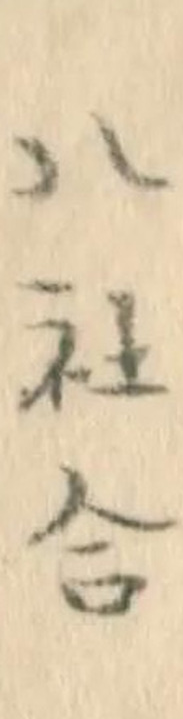八社合
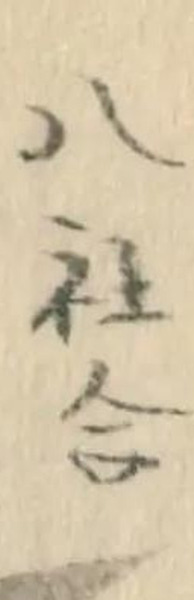八社合
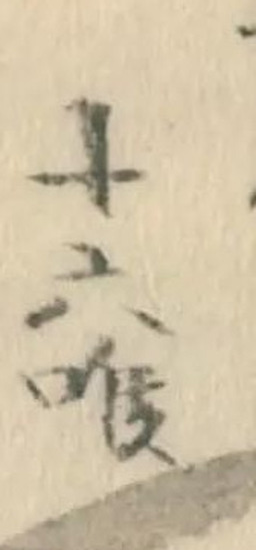十六喉
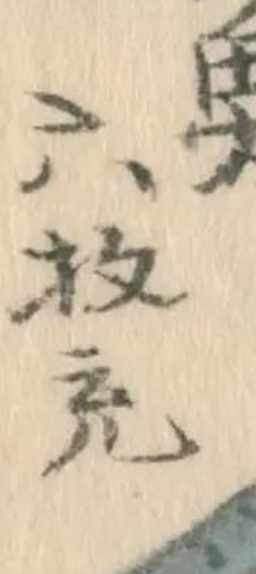六枚充
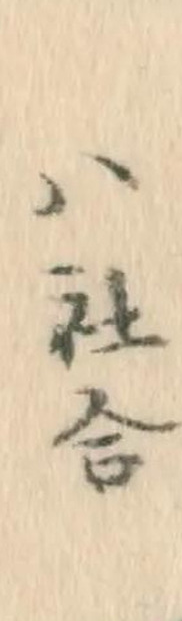八社合
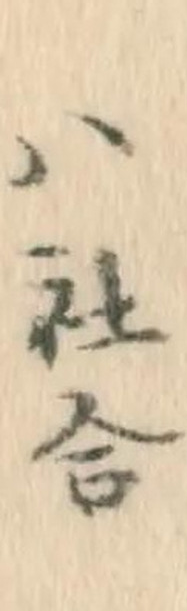八社合
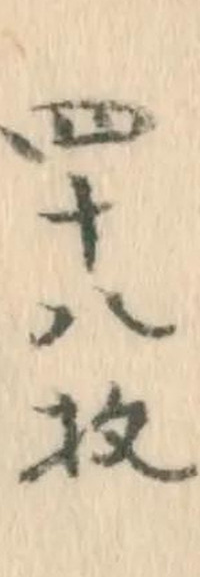四十八枚
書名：葵御祭供進之神饌諸品色目書
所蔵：国立国会図書館 National Diet Library, JAPAN
